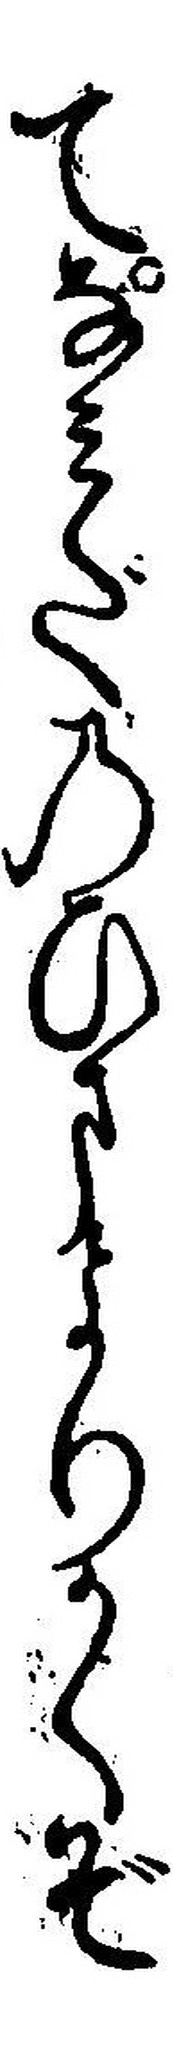て。なみだのひまよりかくぞ
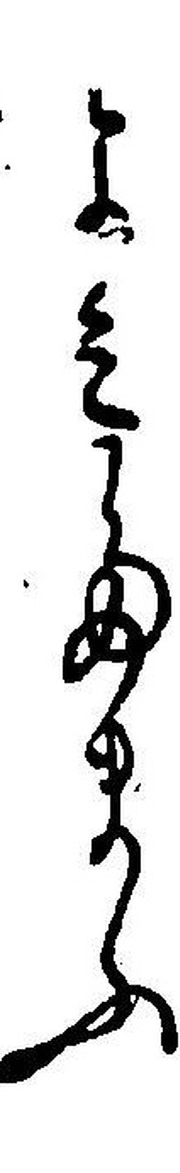よみたまふ
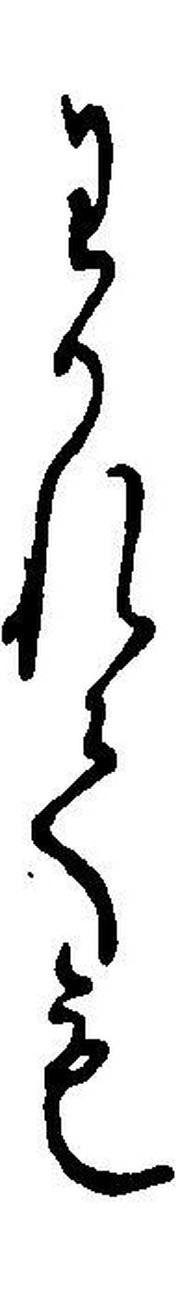わかれても
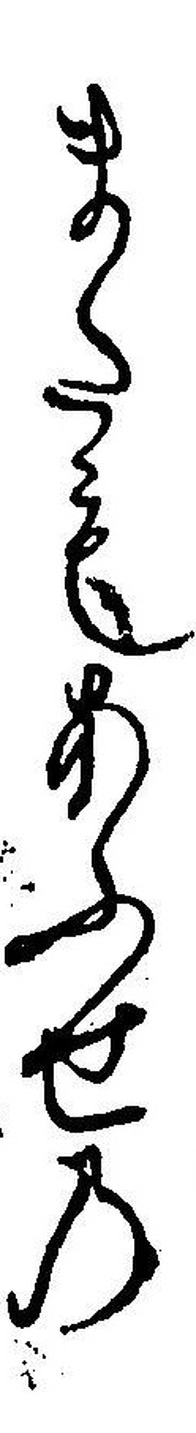またもあふせの
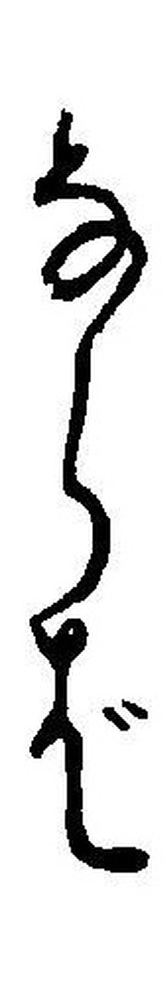ならば
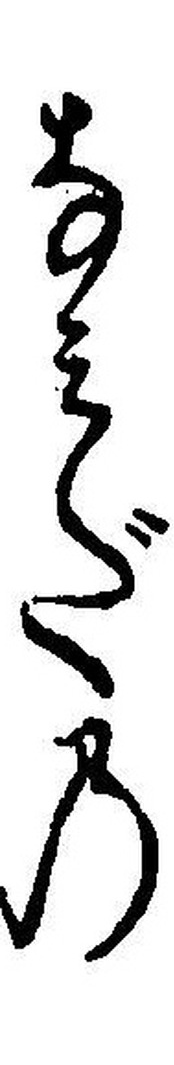なみだの
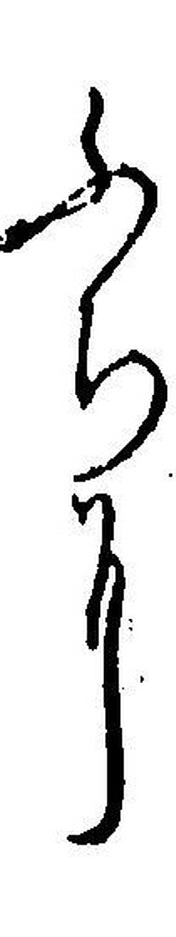ふちに
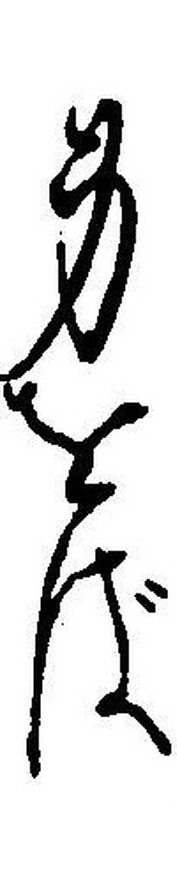身をば
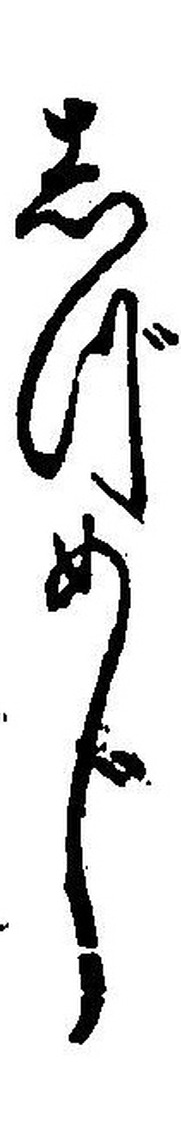しづめじ
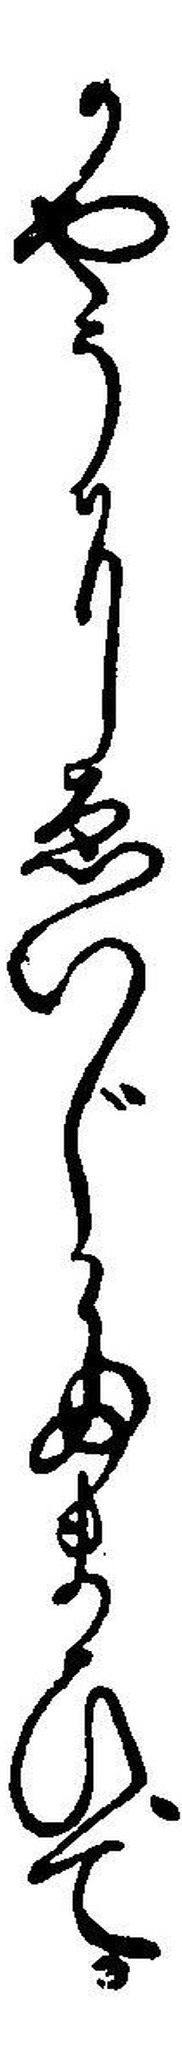かやうにゑいじたまひて。
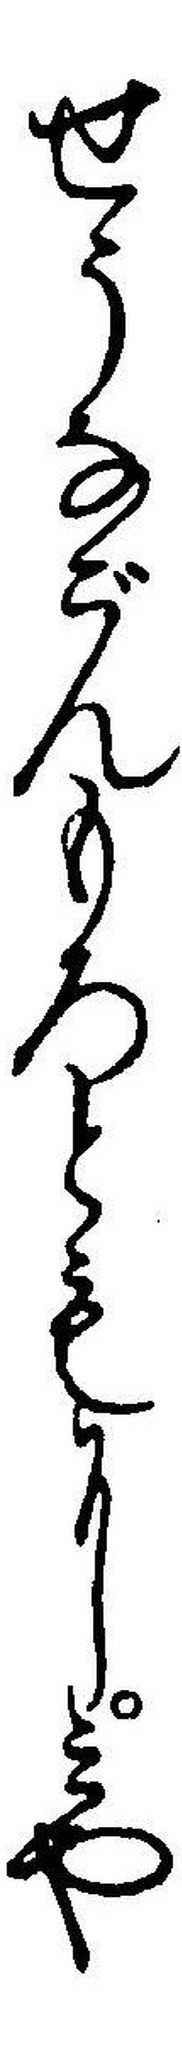せうなごんもろともに。みや
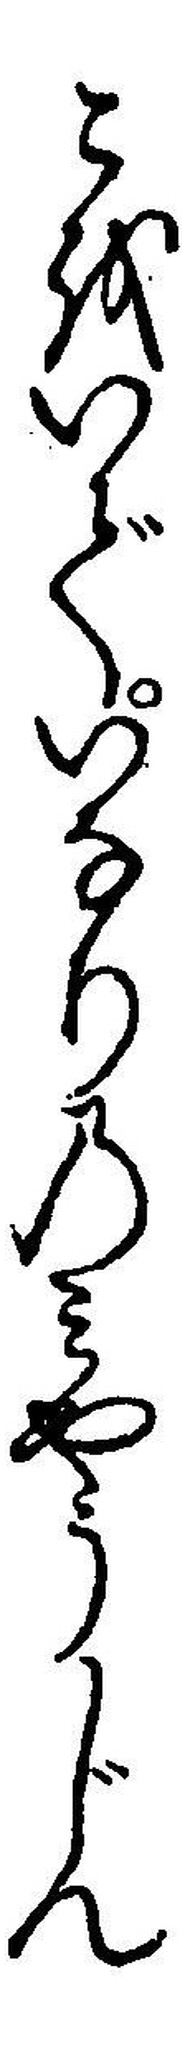こをいで。いなりのみやうじん
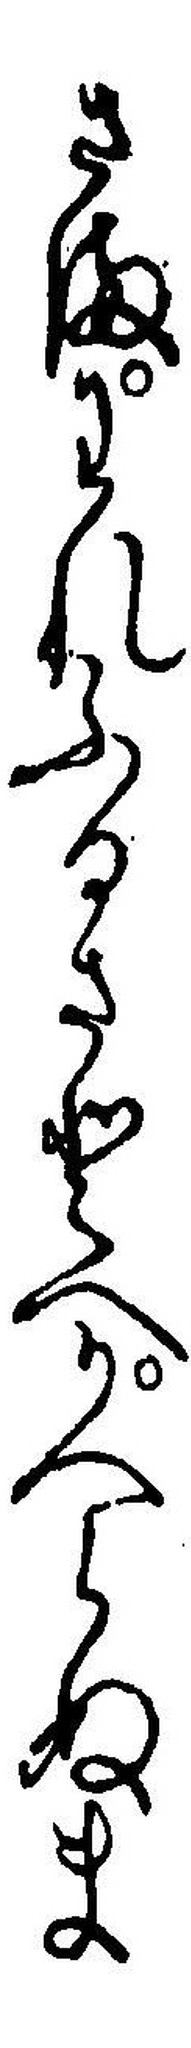さま。われふるさとへ。かへらぬま
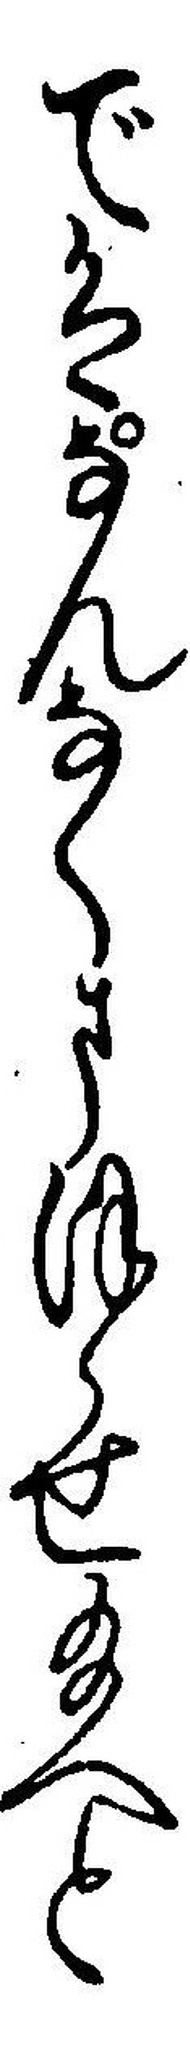では。なんなくまほらせ給へと
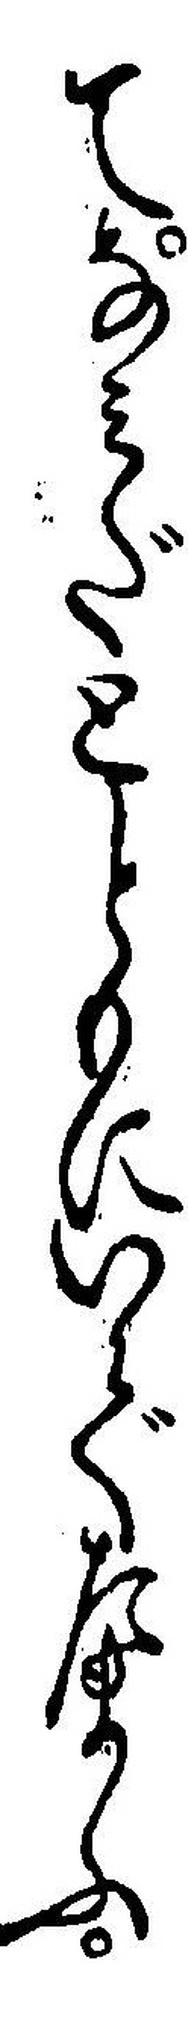て。なみだとともにいでたまふ。
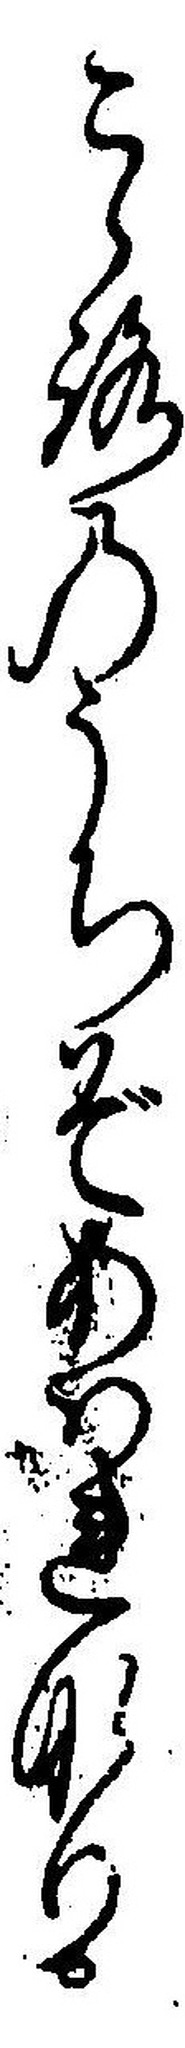こゝろのうちぞあはれなり。
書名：木幡きつね
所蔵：東京大学総合図書館 General Library in the University of Tokyo, JAPAN
